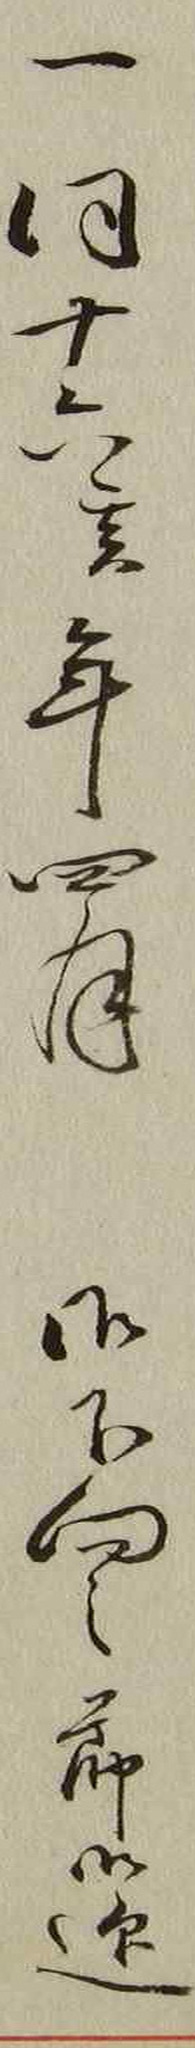一同十六亥年四月御下向之節御迎
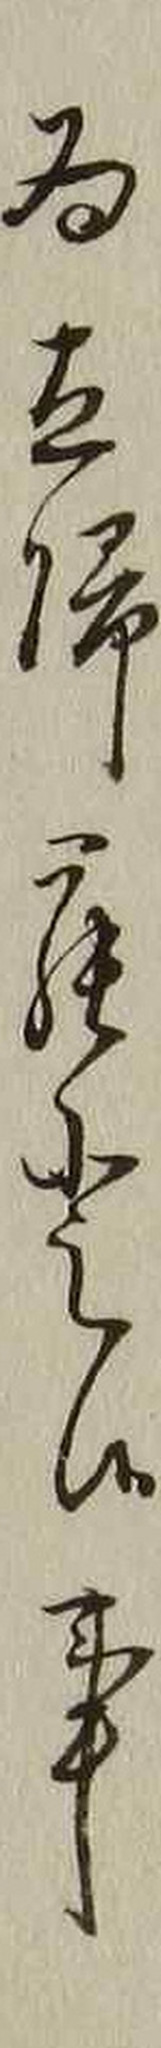為立帰罷登候事
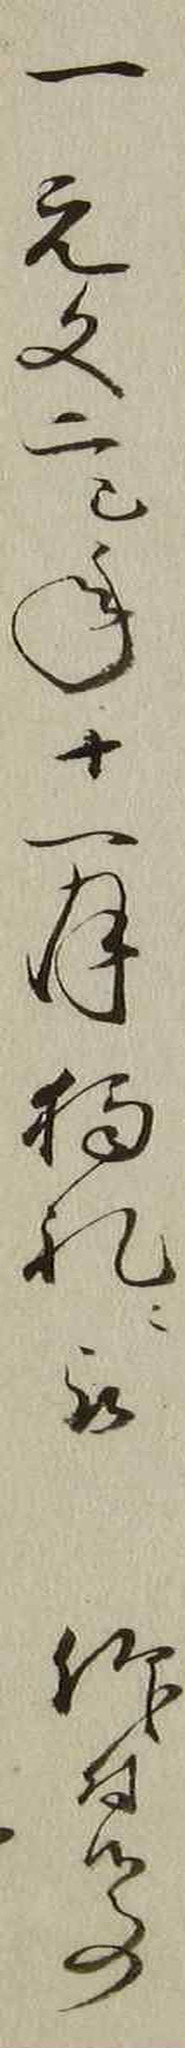一元文二巳年十一月独礼被仰付候事
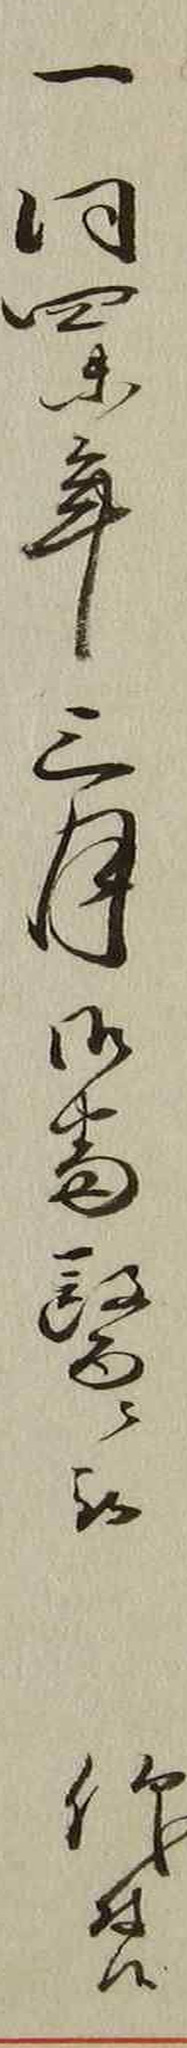一同四未年三月御番医ニ被仰付候
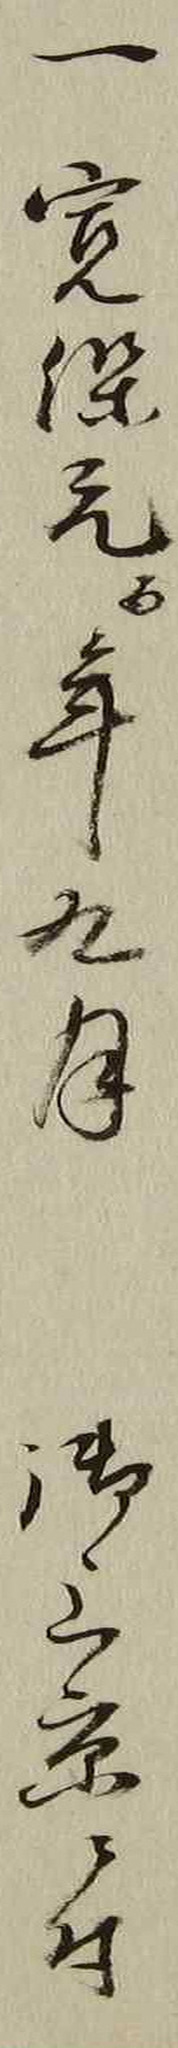一寛保元酉年九月御上京ニ付
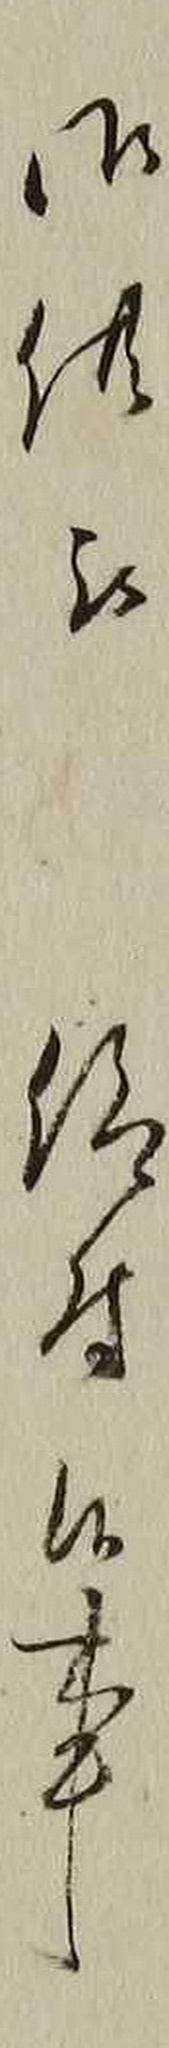御供被仰付候事
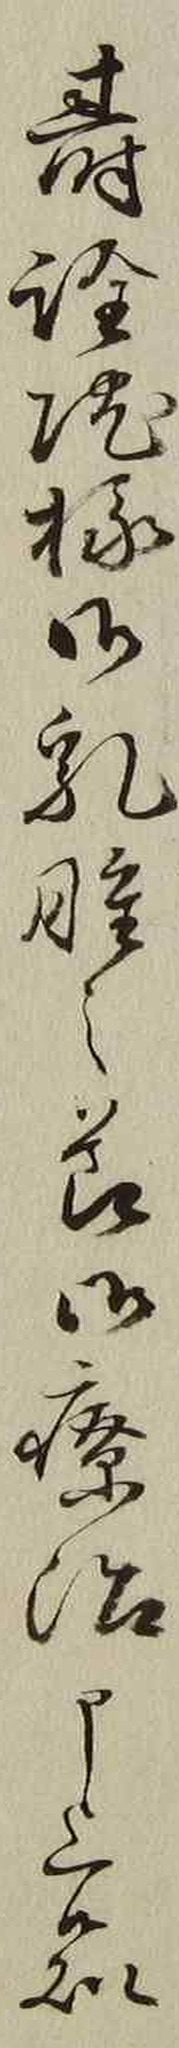寿詮院様御乳腫之節御療治申上候処
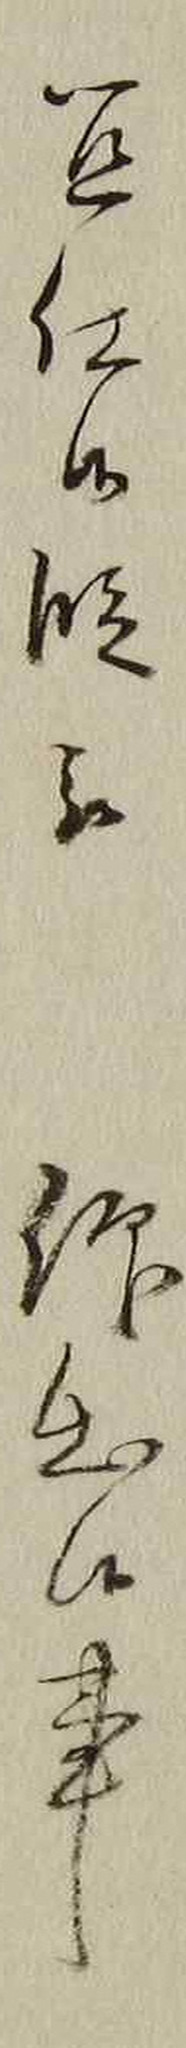宜仕候段被仰出候事
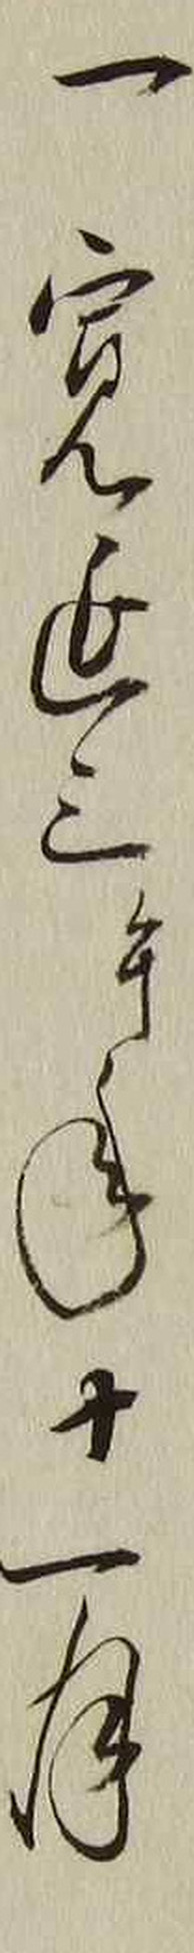一寛延三午年十一月
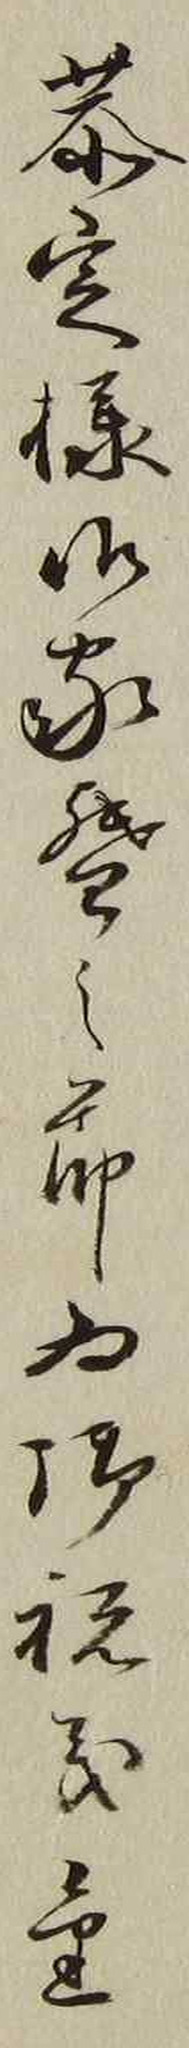恭定様御家督之節為御祝義金
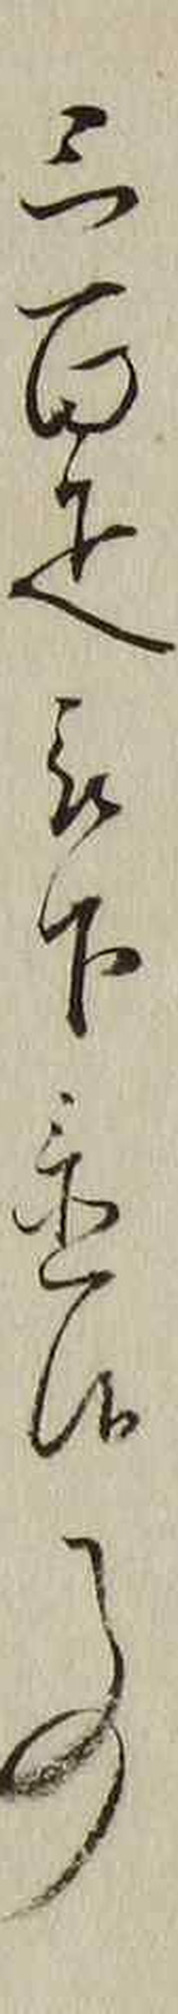三百疋被下置候事
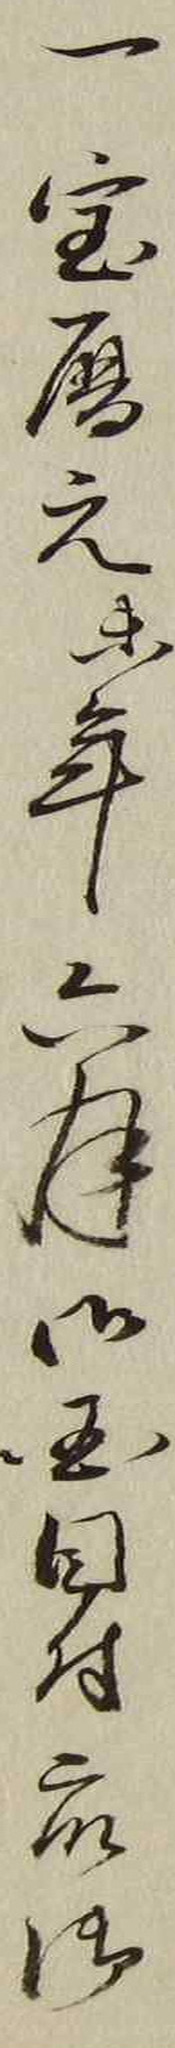一宝暦元未年六月御国目付衆御
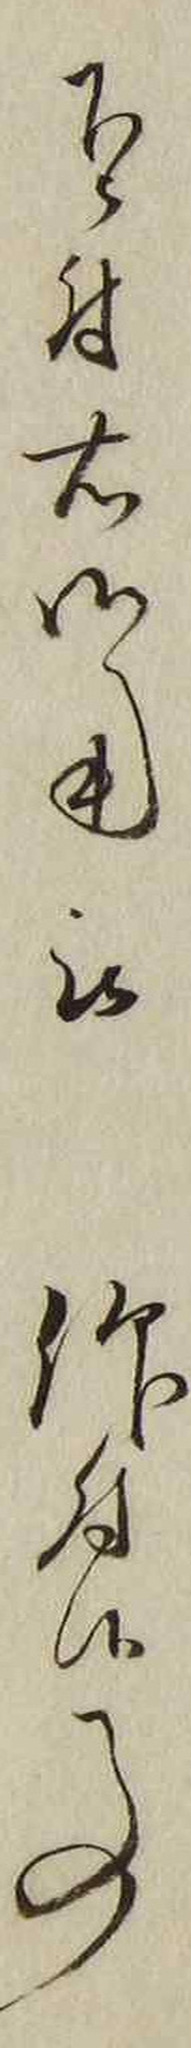下ニ付右御用被仰付候事

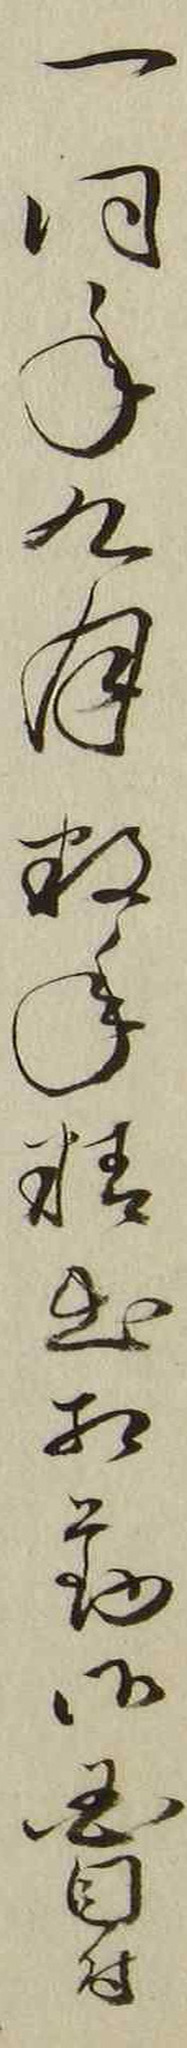一同年九月数年精出相勤御国目付
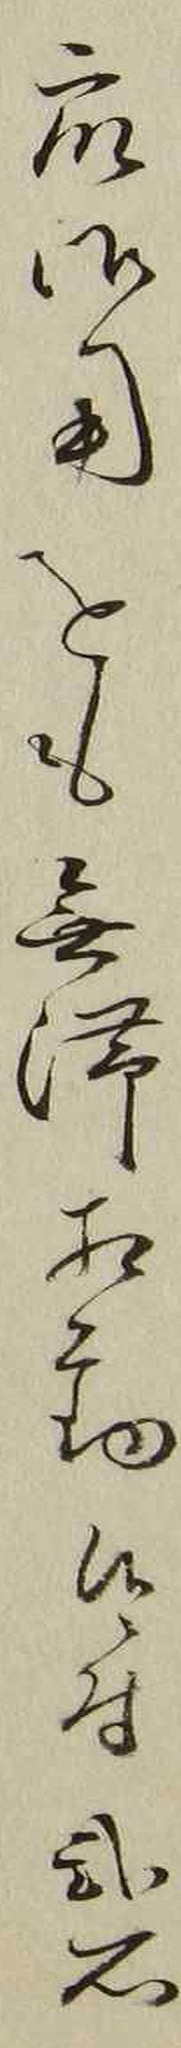衆御用をも無滞相勤候ニ付弐石
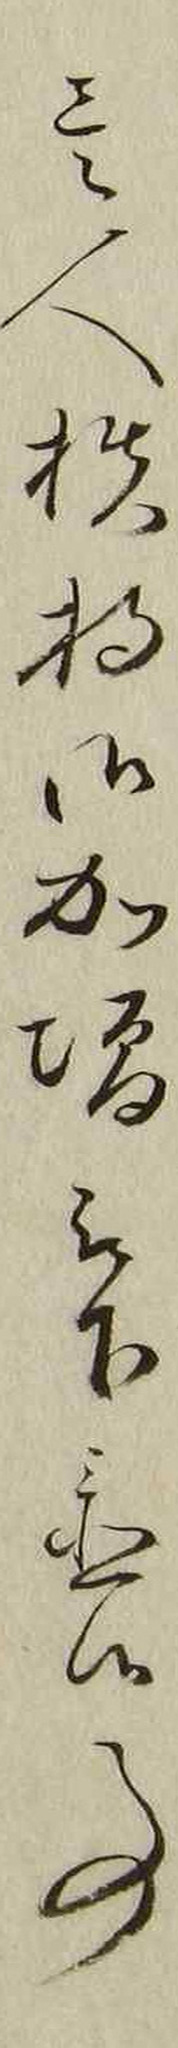壱人扶持御加増被下置候事
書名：諸士系譜　巻之8　い之部8
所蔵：会津若松市立会津図書館
